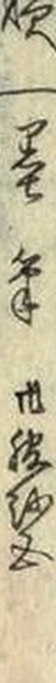墨筆御服紗五
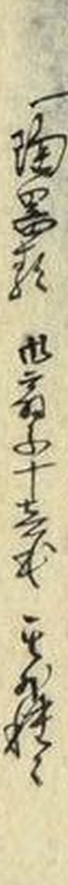陶器類御扇子十壱本其外種々

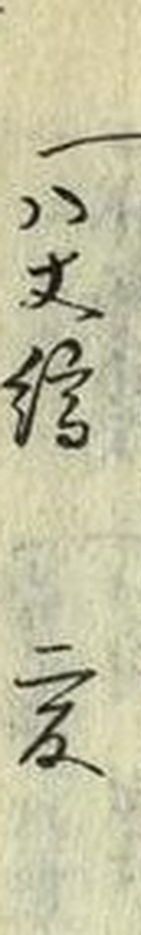八丈縞十反
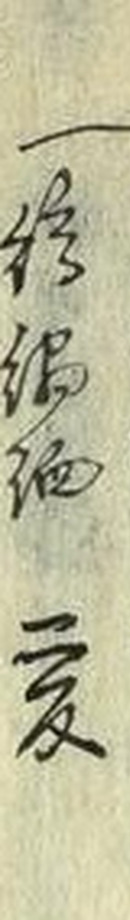縞縮緬二反
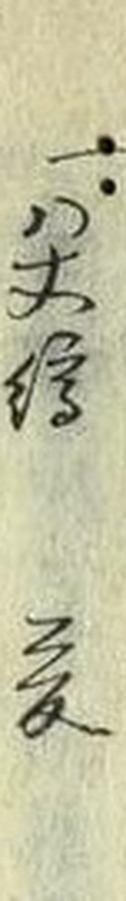八丈縞十反
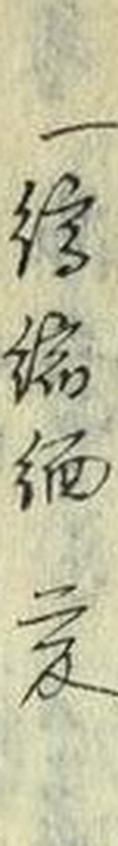縞縮緬二反
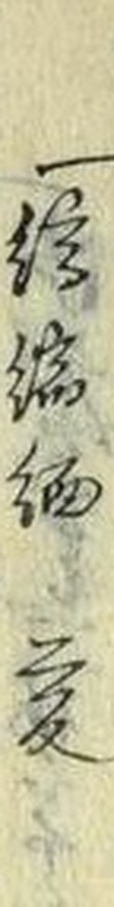縞縮緬二反
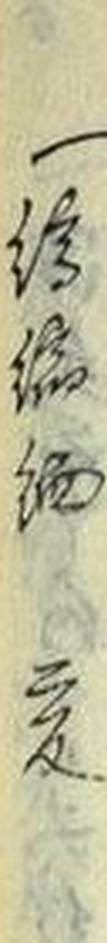縞縮緬二反
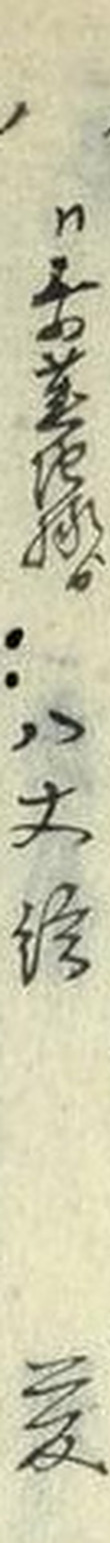ノ同院様ゟ八丈縞二反
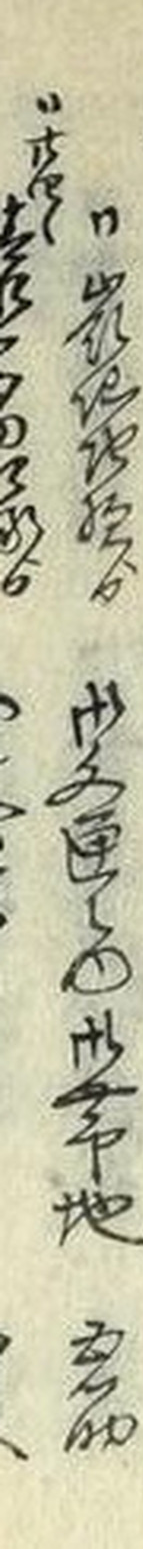ノ同嶺院様ゟ御文匣之内御帯地五筋
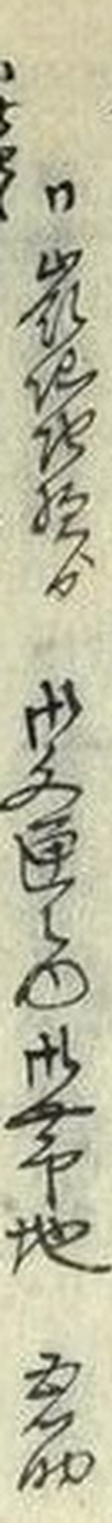ノ同嶺院様ゟ御文匣之内御帯地五筋
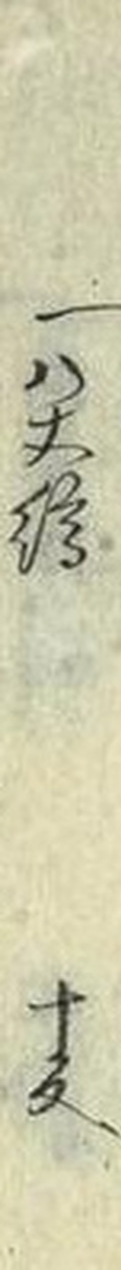八丈縞十反

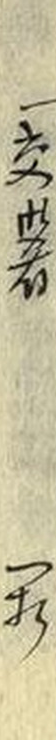交御肴一折
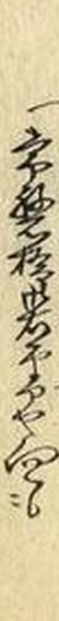常盤橋御右筆部屋向へも
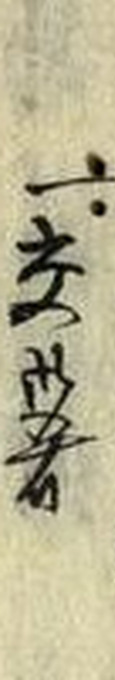交御肴一折
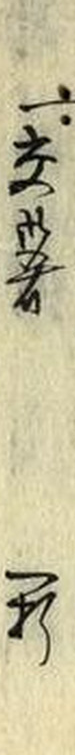交御肴一折
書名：少傅日録抄（斉善付側向頭取日記、在府）
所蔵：福井県文書館 Fukui Prefectural Archives
